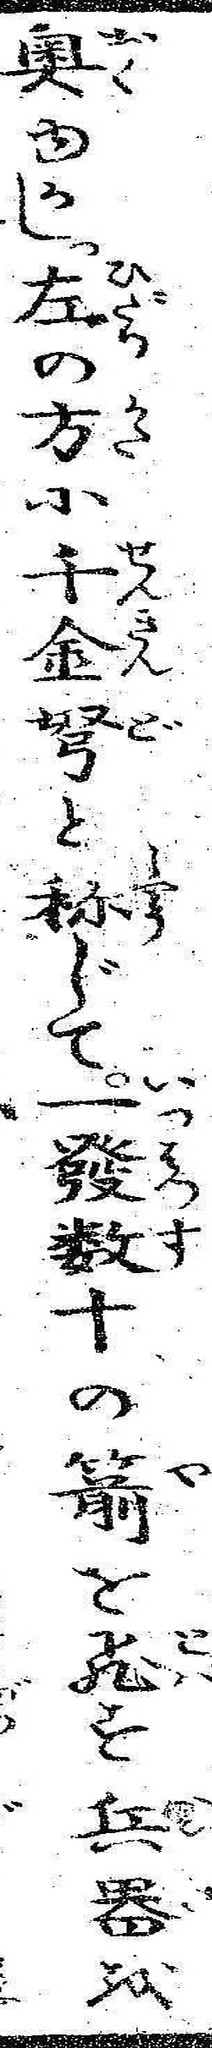奥ゆかし。左の方に千金弩と称じて。一発数十の箭を飛す兵器を
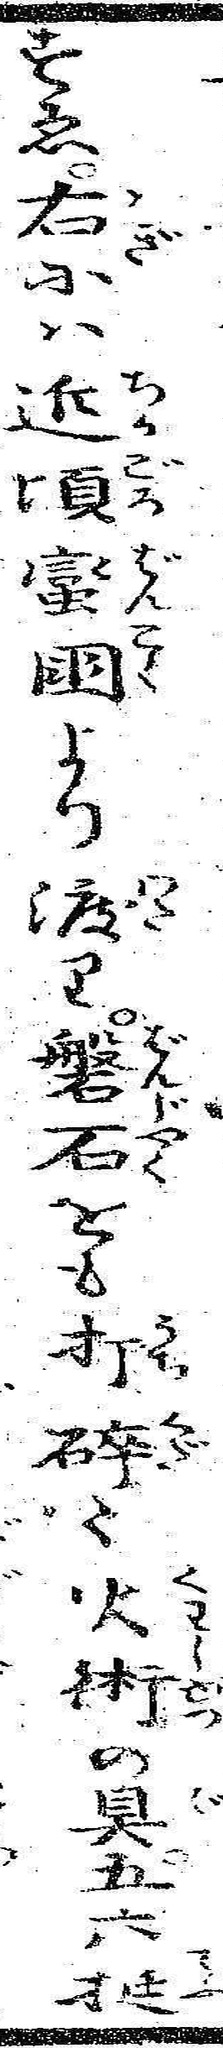すゑ。右には近頃蛮国より渡り。磐石をも打砕く火術の具。五六挺
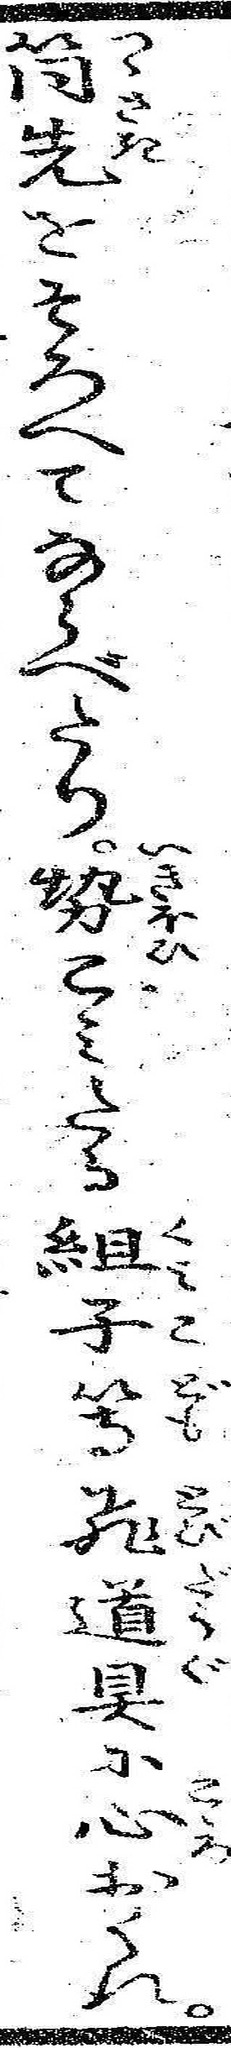筒先をそろへてならべたり。勢こみたる組子等飛道具に心おくれ。
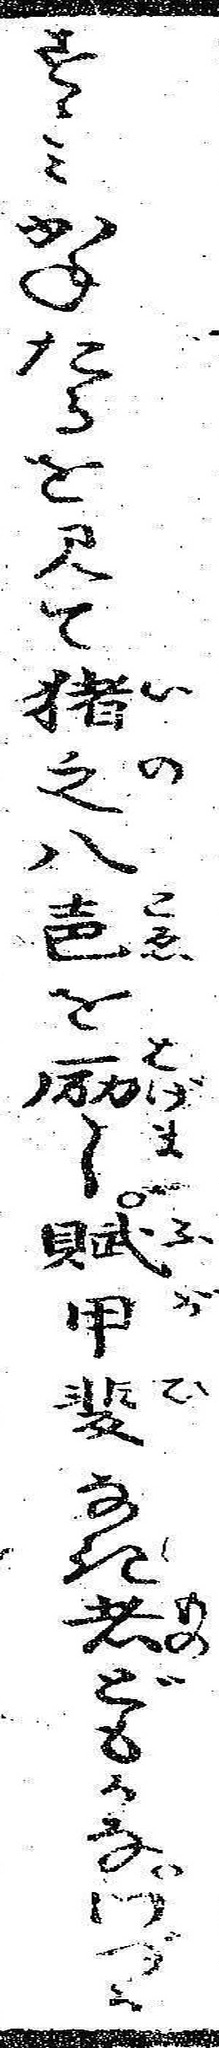すゝみかねたるを見て猪之八声を励し。賦甲斐なき者どもかな。わづか
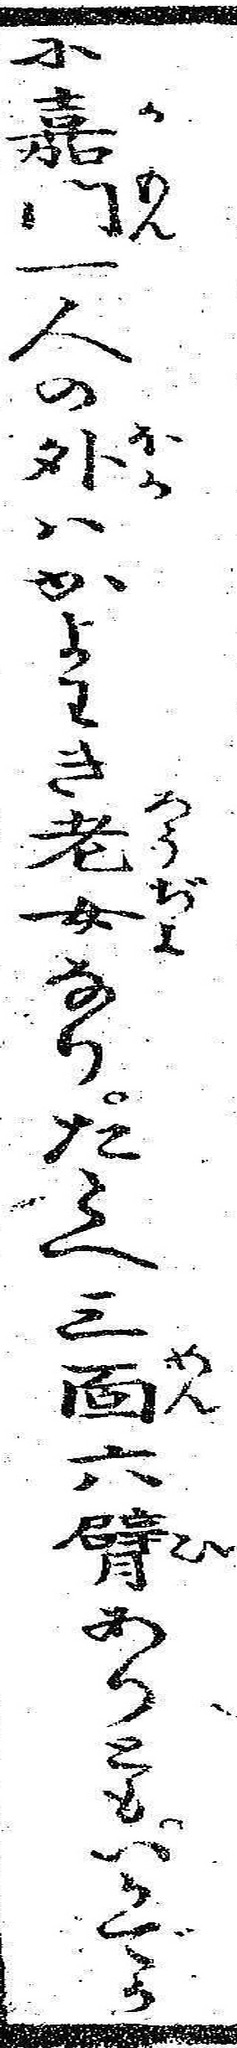に嘉門一人の外はかよわき老女なり。たとへ三面六臂ありとも。いかでか
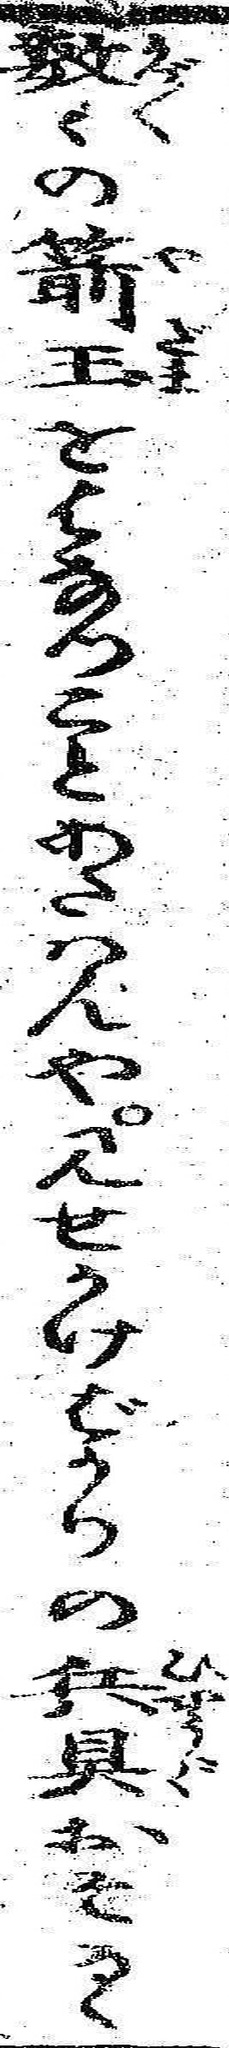数々の箭玉をはなつことあたはんや。見せかけばかりの兵具おそるゝ
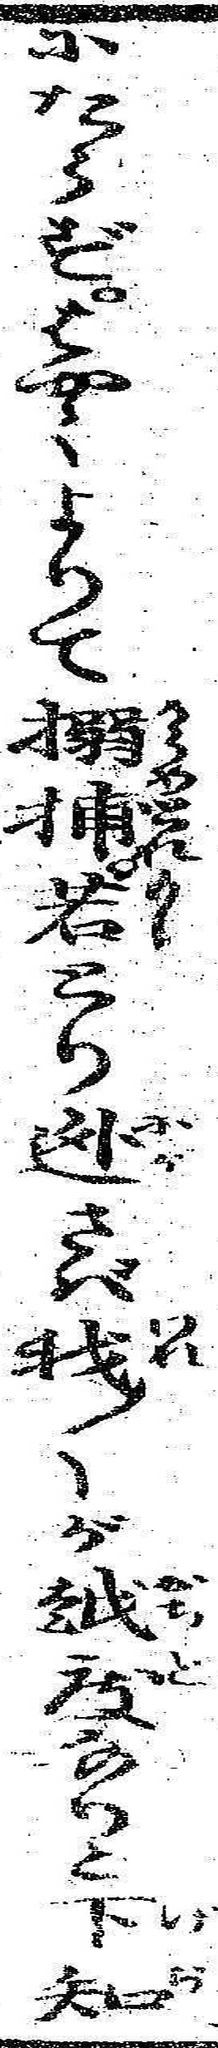にたらず。はやくよりて搦捕。若とり逃さば我々が越度なりと下知
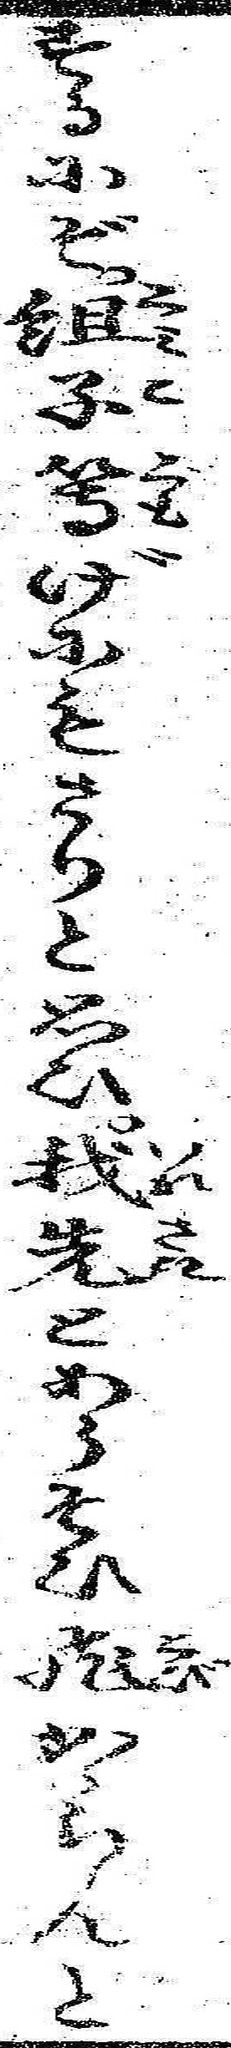するにぞ。組子等げにもさりと思ひ。我先とあらそひ飛かゝらんと
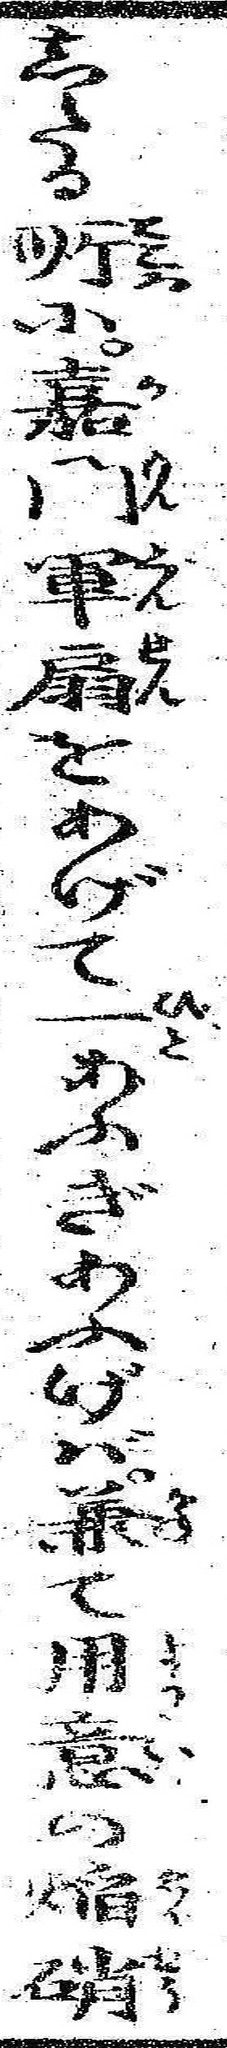したる所に。嘉門軍扇をあげて一あふぎあふげば。兼て用意の焰硝
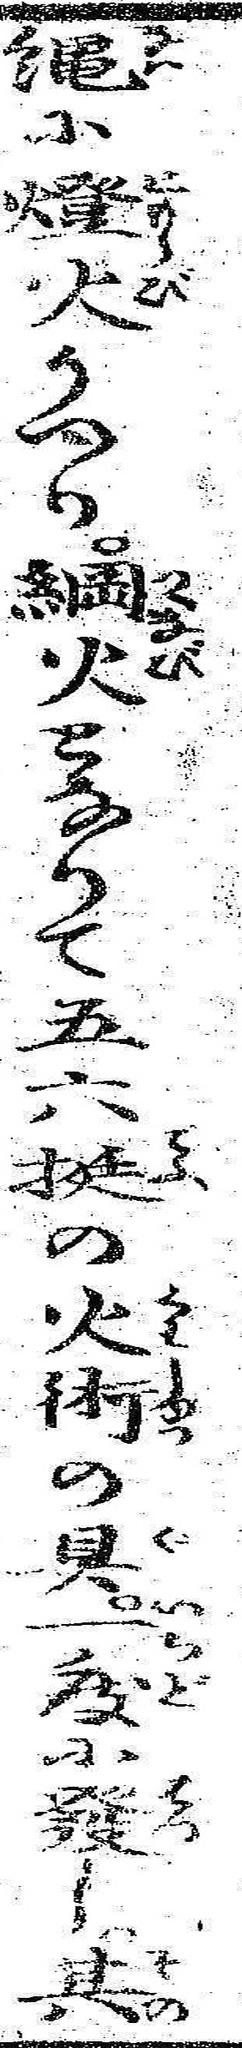縄に灯火うつり。綱火となりて五六挺の火術の具。一度に発し。其
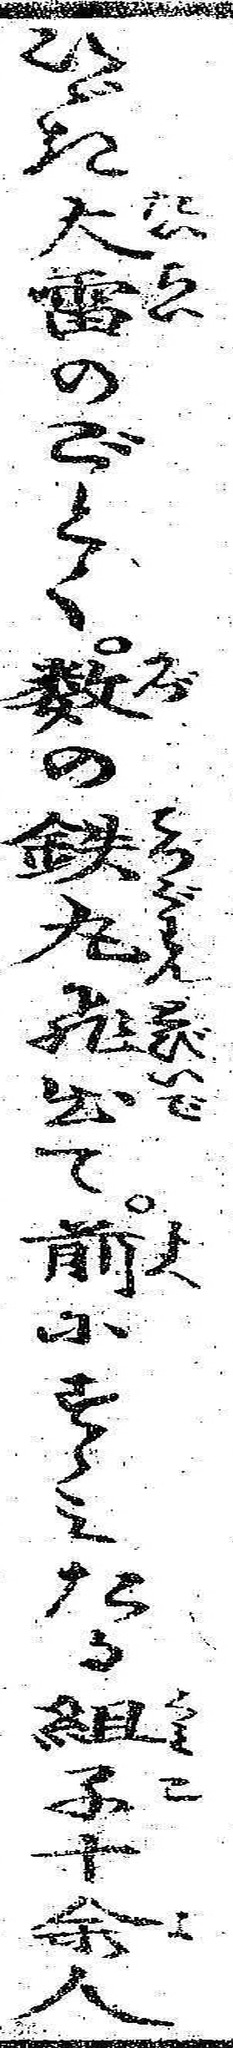ひゞき大雷のごとく。数の鉄丸飛出て。前にすゝみたる組子十余人
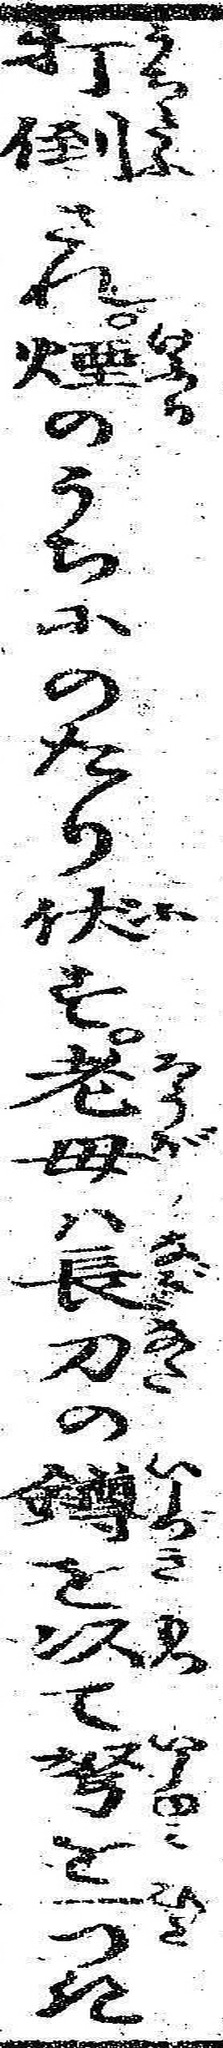打倒され。煙のうちにのたり伏す。老母は長刀の鐏を以て弩を一つき
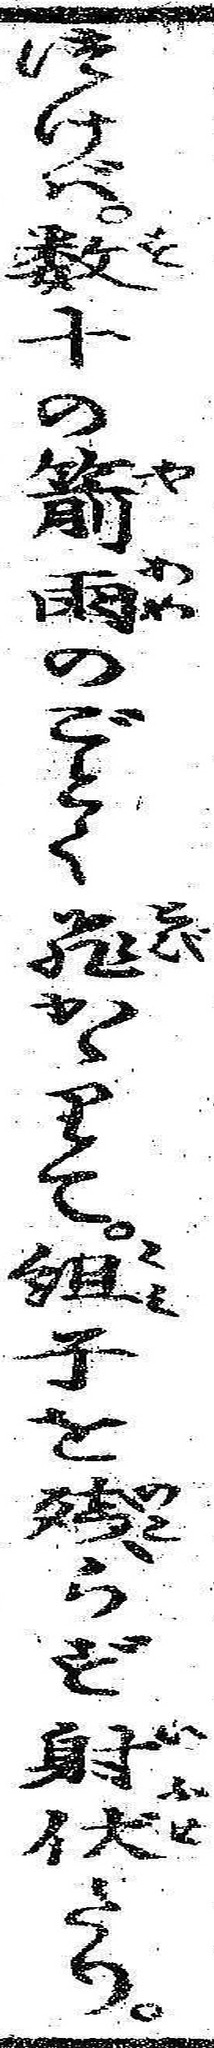つけば。数十の箭雨のごとく飛かゝりて。組子を残らず射伏たり。
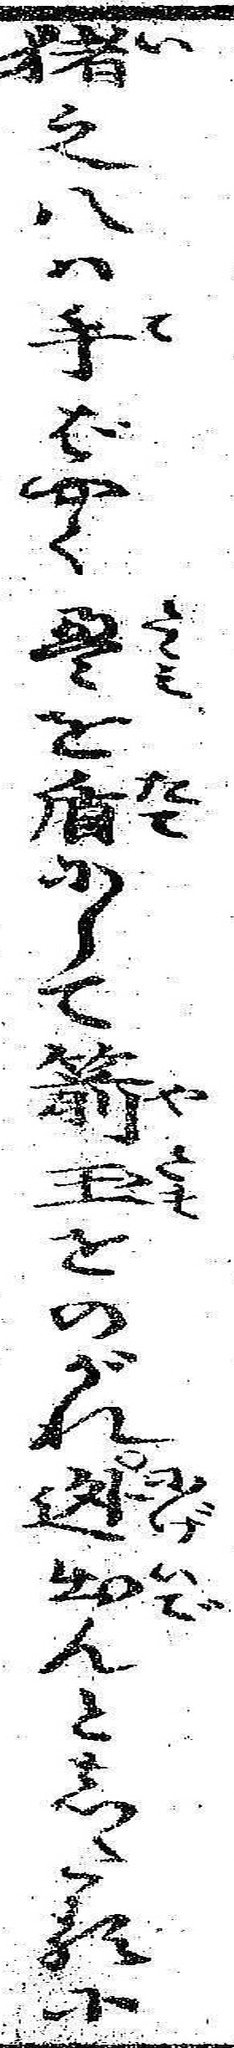猪之八は手ばやく畳を盾にして箭玉をのがれ。逃出んとしたるに
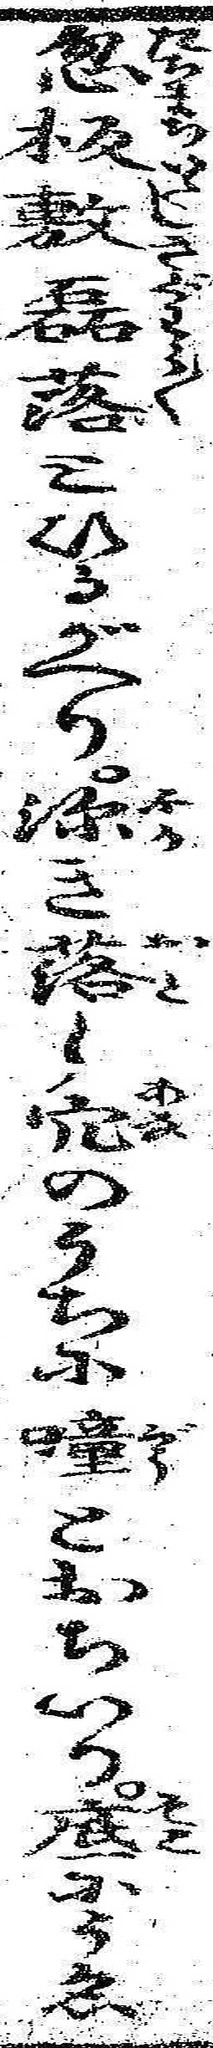忽板敷磊落とひるがへり。深き落し穴のうちに噇とおちいり。底にうゑ
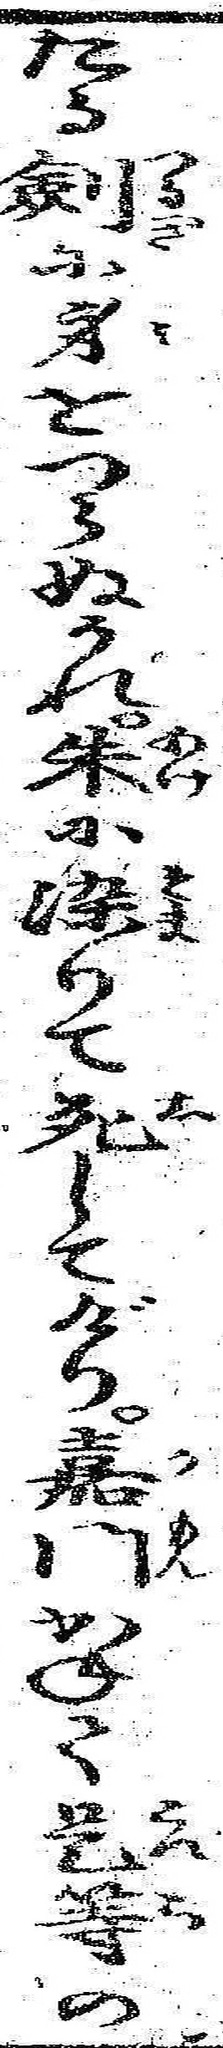たる剣に身をつらぬかれ。朱に染りて死してげり。嘉門かねて是等の
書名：昔話稲妻表紙
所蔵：国文学研究資料館
